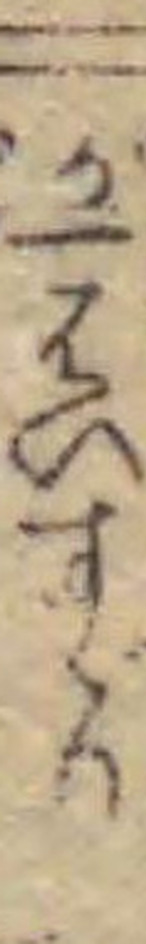が一はいすゞり
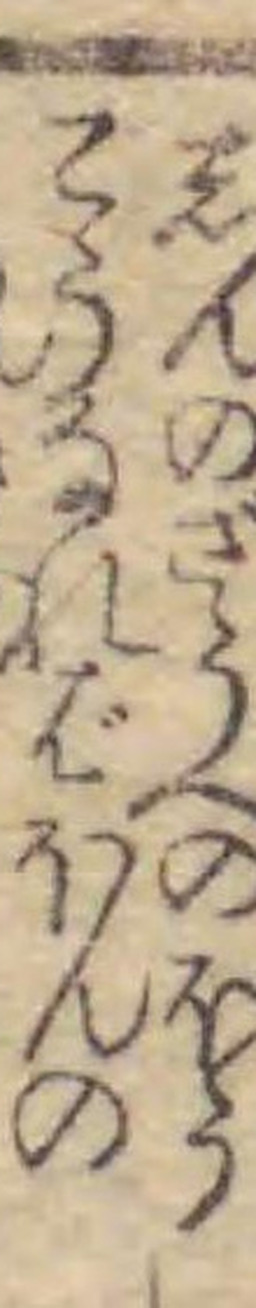こうなればほんの
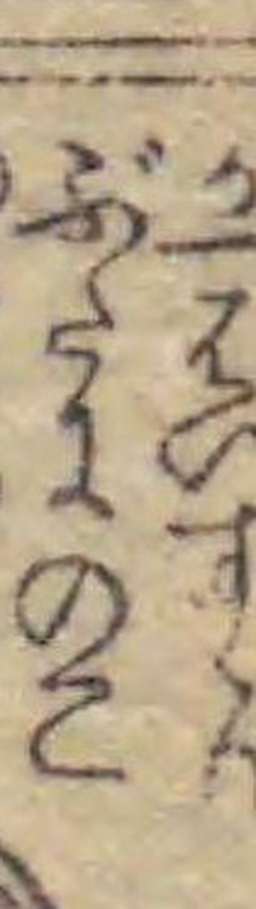ぶたにのこ
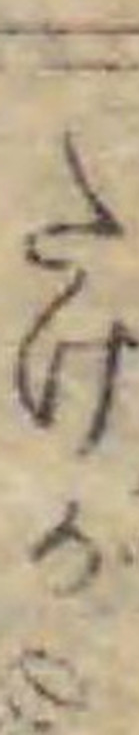たけが
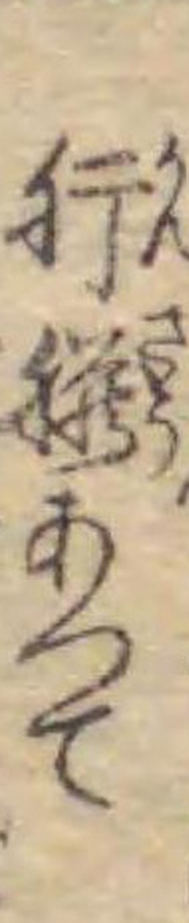肝臓あつて
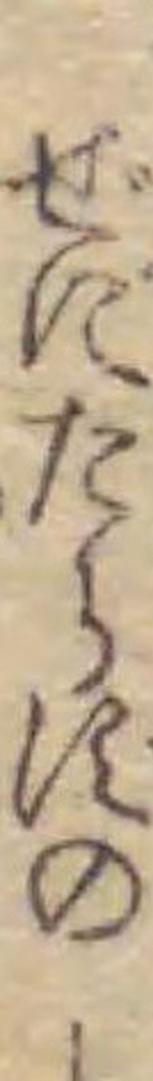ぜにたらずの
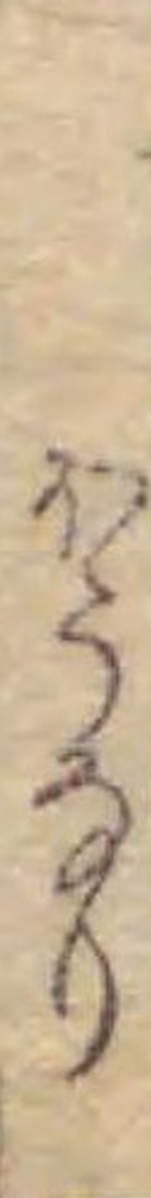ほうなり
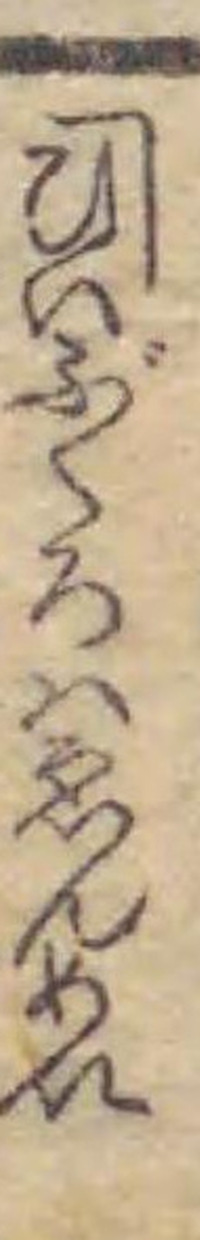〽ひいぶくろはゑんめい
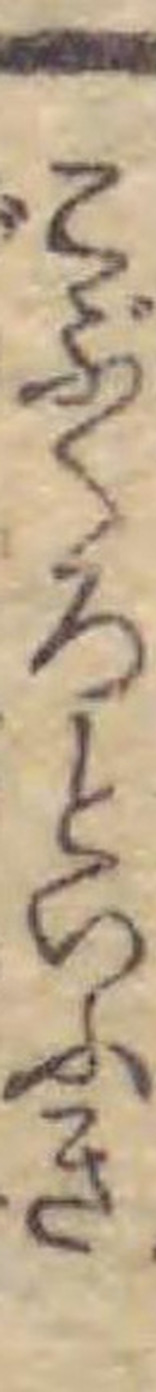こぶくろといふき
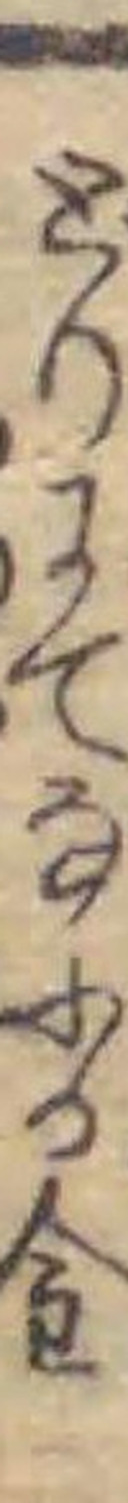どりにてなにか金
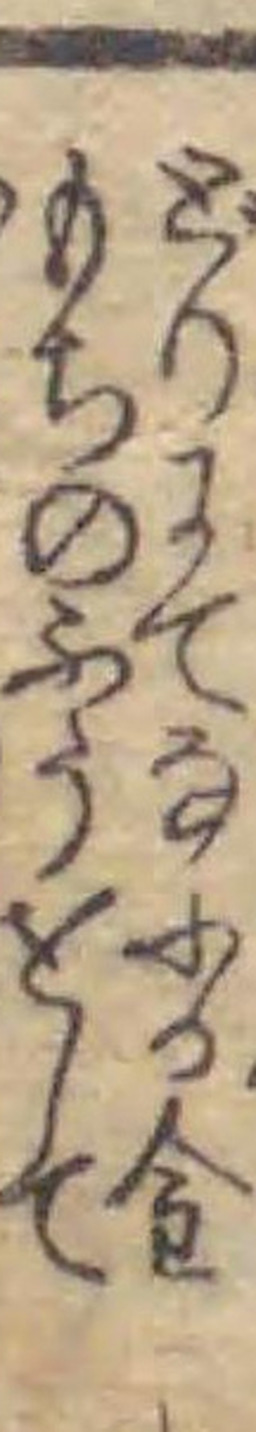もちのふうをして
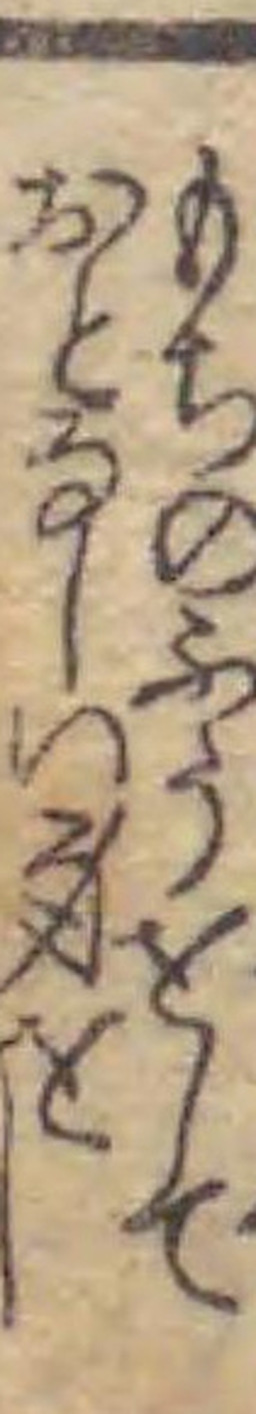おとなしい身をし
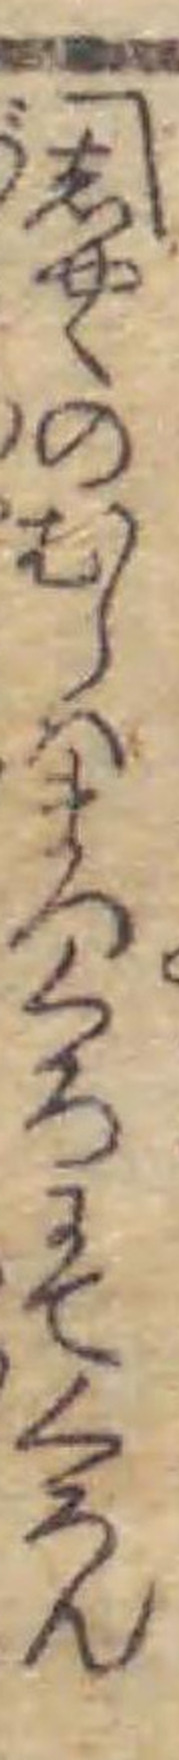〽しやくのむしはまつくろにてくろん
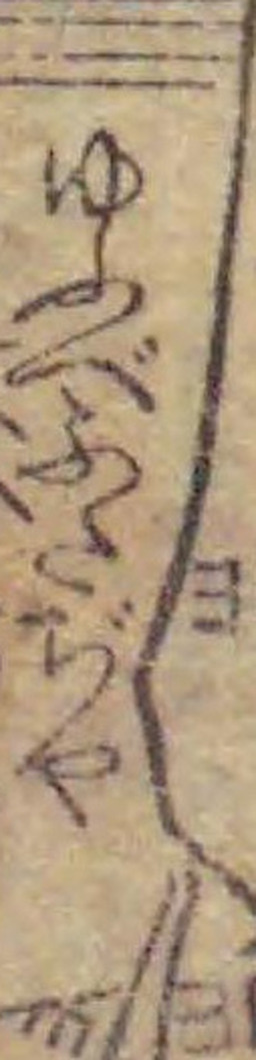ゆふべふたぢや
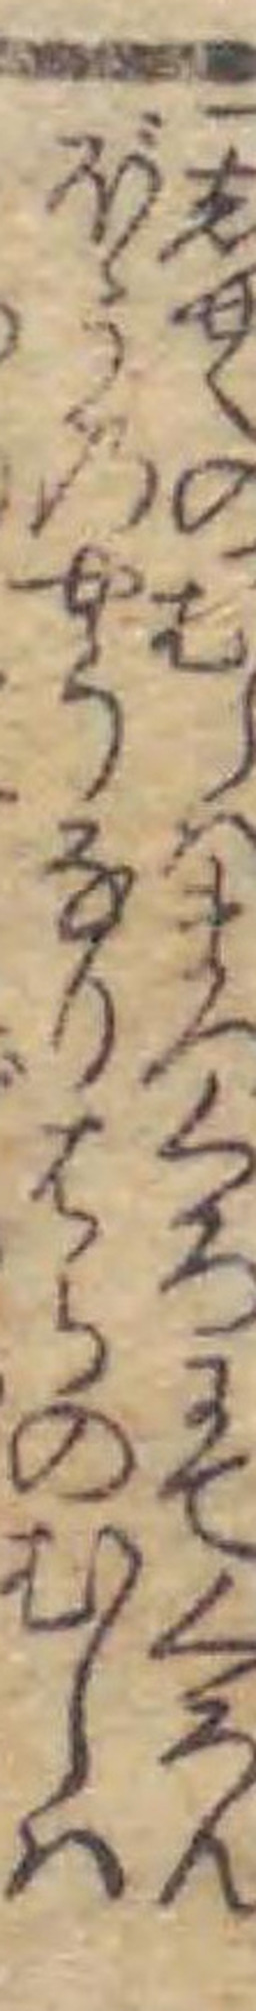ぼうのやうなりはらのむしは
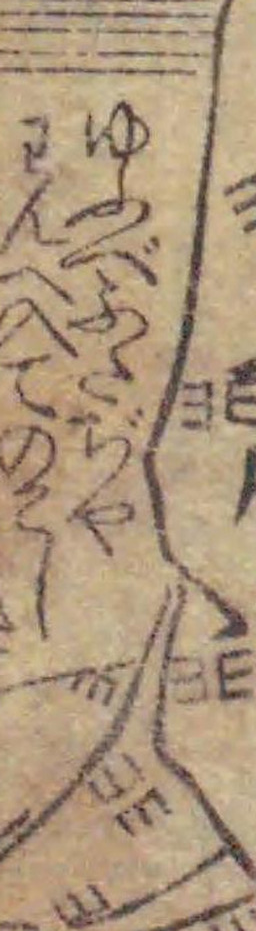ゆふべふたぢや
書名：十四傾城腹之内 : 3巻
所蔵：国立国会図書館 National Diet Library, JAPAN
